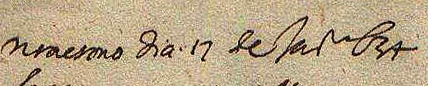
no mesmo dia. 17 de Ianro 634
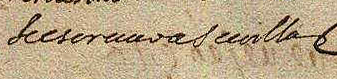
se escreueo a seuilla
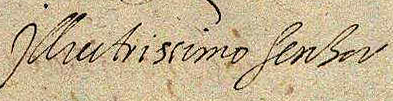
Jllustrissimo Senhor
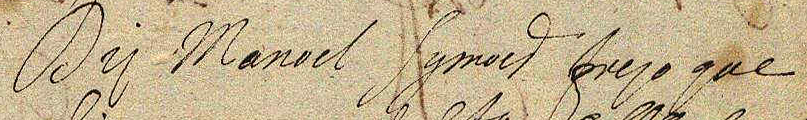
Diz Manoel Symoẽs prezo que
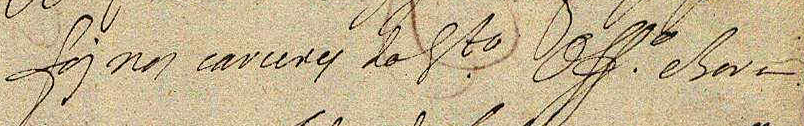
foj nos carceres do St.o Off.o e hora
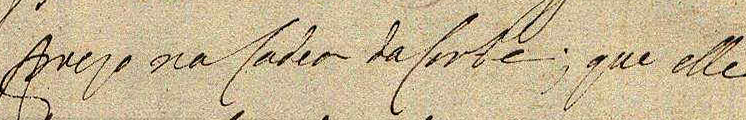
prezo na Cadea da Corte; que elle
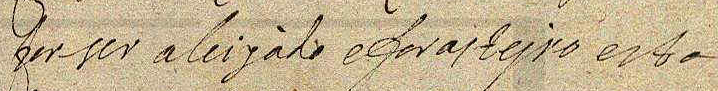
por ser aleijado e forasteiro esta
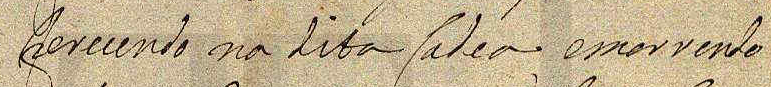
perecendo na dita Cadea e morrendo
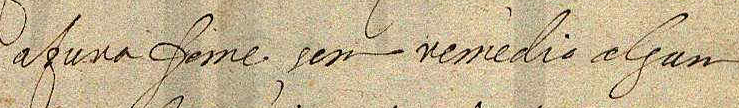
a pura fome; sem remedio algum
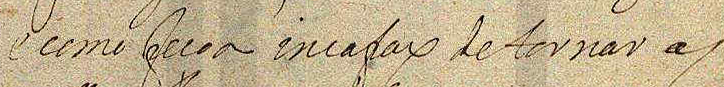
e como peçoa incapax de tornar as
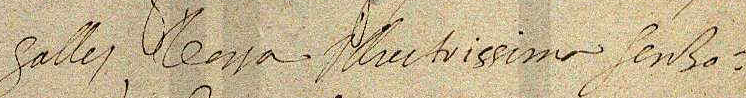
galles, Vossa Jllustrissima senho
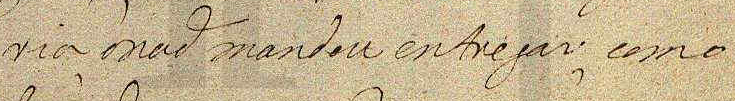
ria o naõ mandou entregar, como
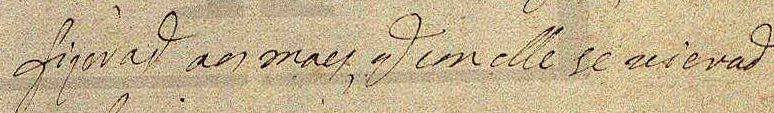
fizeraõ aos maes, q̄ con elle se uieraõ
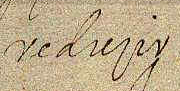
reduzir.
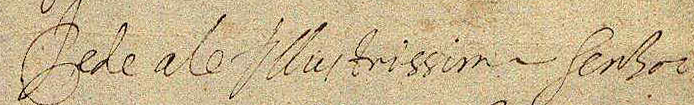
Pede a V Jllustrissima Senhor
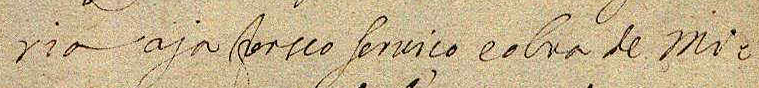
ria aja por seo seruiço e obra de mi
